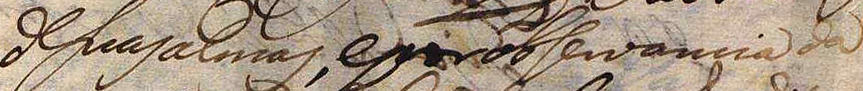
de suas almas, e por observancia da
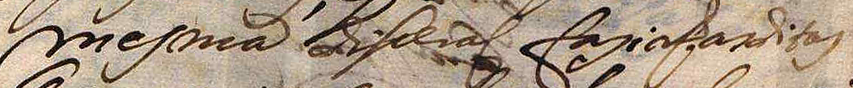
mesma disserā faziā as ditas
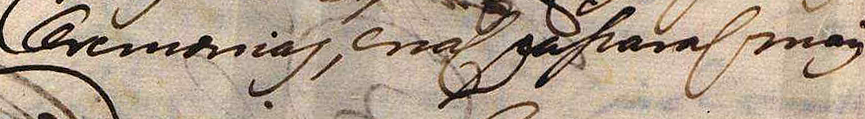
Ceremonias, e nā passarā mais
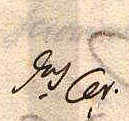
d.as Cer.
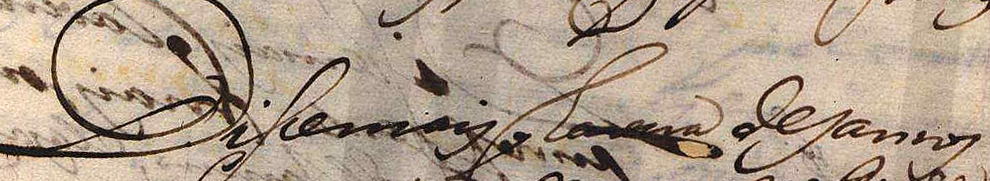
Disse mais hauera des annos
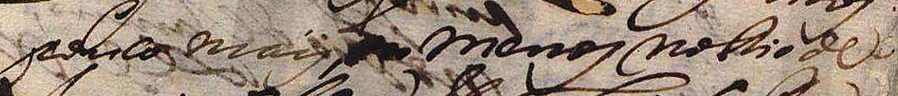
pouco mais, _ menos no Rio de
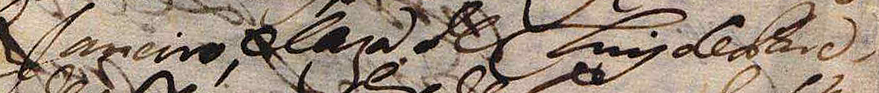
Janeiro, e Caza de Luis de Pare
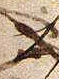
L
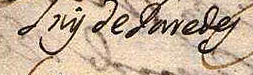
Luis de Paredes
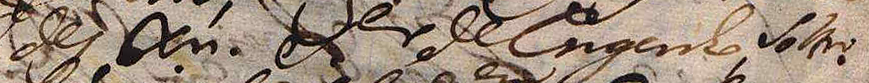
des xn. s.or de Engenho, soltr.o
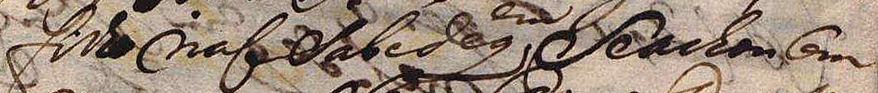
filho nā sabe de qem se achou Com
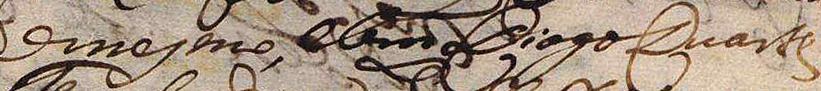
o mesmo, e com Diogo Duarte
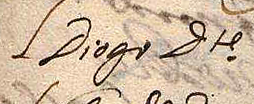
L Diogo Dte.
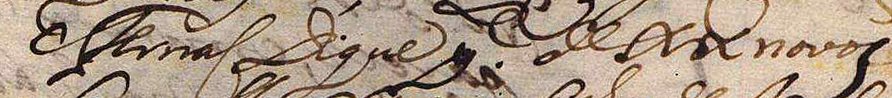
e Fernā Dique p.te de xx novos
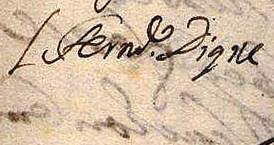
L Fernd.o Dique
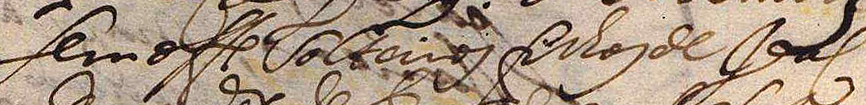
sem offo Solteiros filhos de Joā
